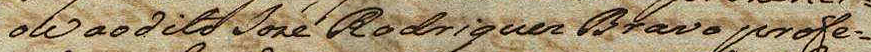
ou ao dito Iozé Rodriguez Bravo profe
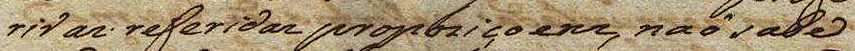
rir as referidaz propoziçoenz naõ sabe
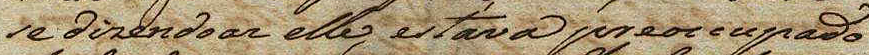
se dizendoaz elle, estava preoccupado
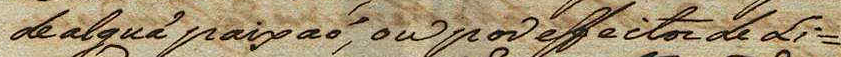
de alguā paixaõ, ou por effeitoz de Li
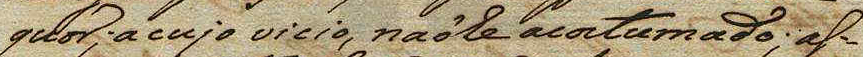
quor; a cujo vicio, naõ he acostumado; as
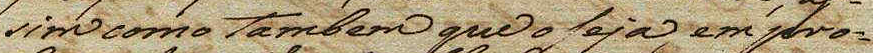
sim como tambem que o seja em pro
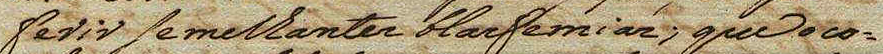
ferir semelhantes blasfemiaz; que o co
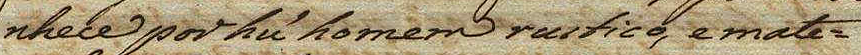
nhece por hū homem rustico, e mate
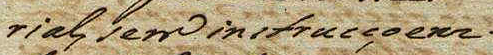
rial, sem instrucçoenz
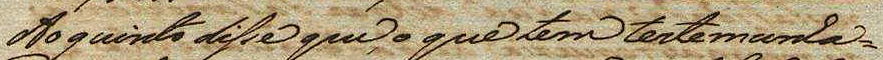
Ao quinto disse que o que tem testemunha
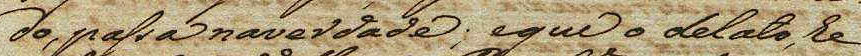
do, passa na verdade; e que o delato, he
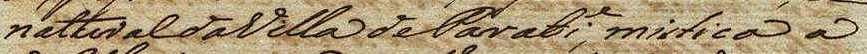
natural da Villa de Parati; mistica a
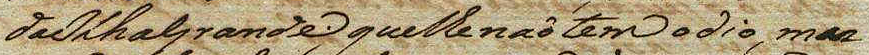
da Ilha Grande, que lhe naõ tem odio, mas
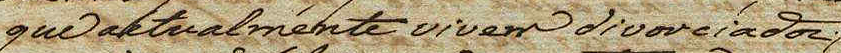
que actualmente vivem divorciadoz,
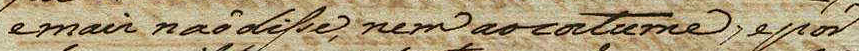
e maiz naõ disse, nem ao costume, e por
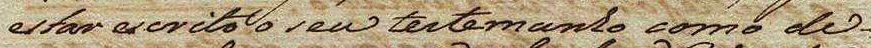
estar escrito o seu testemunho como de
